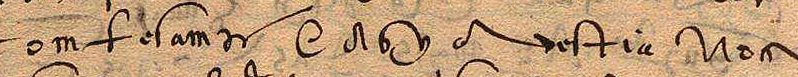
Comfesamte e Asy a vestia Nos
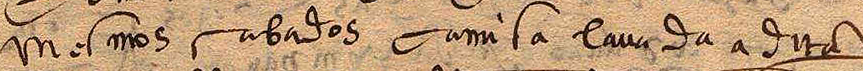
mesmos sabados camisa lauada a dita
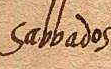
sabbados
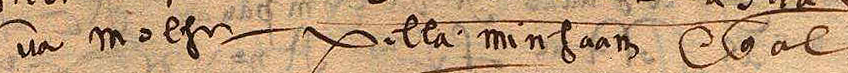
sua molher pella menhaam e q̄ al
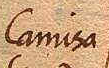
Camisa
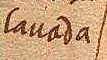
lauada
